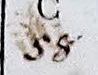58
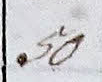50
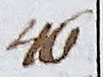46
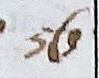56
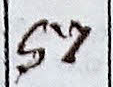57
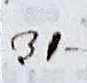31
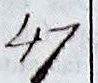47
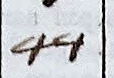44
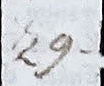29
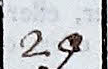29
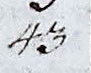43
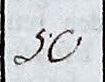50
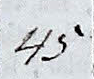45
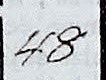48
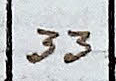33
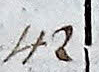42
